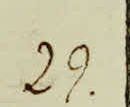29.
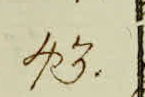43.
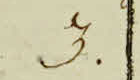3.
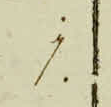1.
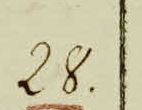28.
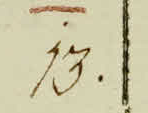13.
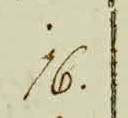16.
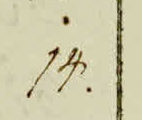14.
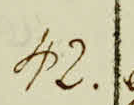42.
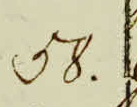58.
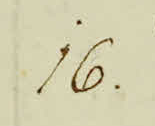16.
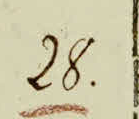28.
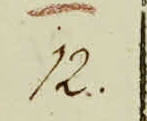12.
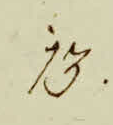13
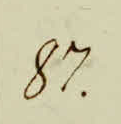87.
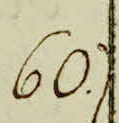60.
